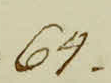64
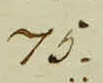75
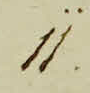11
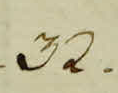32
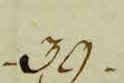39
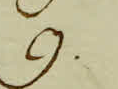9.
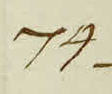74
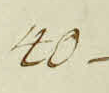40
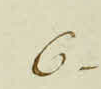6
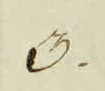3
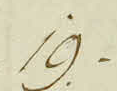19
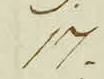17
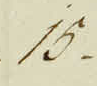15
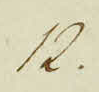12
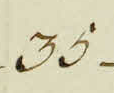35
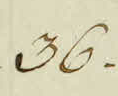36
